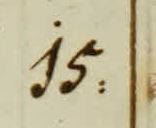15:
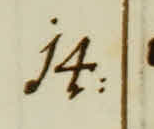14:
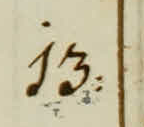13:
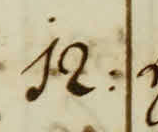12:
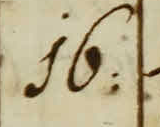16:
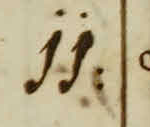11:
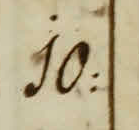10:
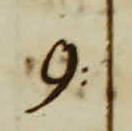9:
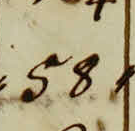58
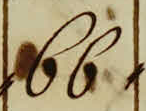66
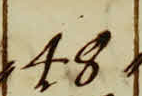48
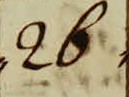26
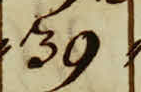39
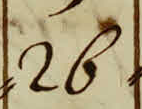26
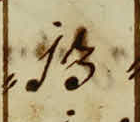13
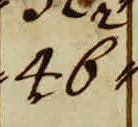46
